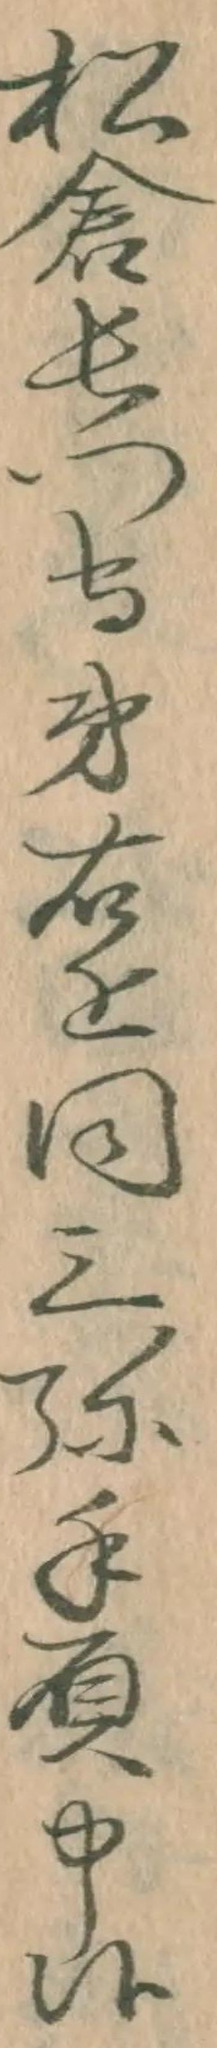松倉ながと守弟右近同三弥手負申候
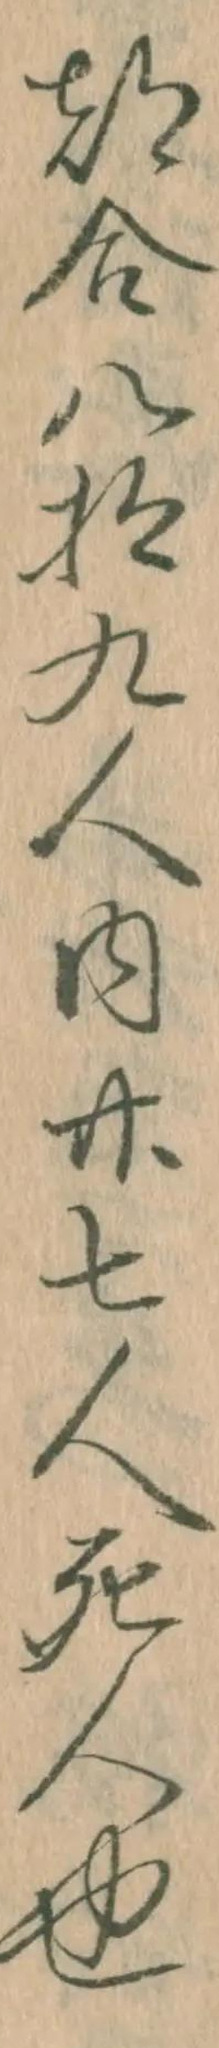都合八拾九人内廿七人死人也
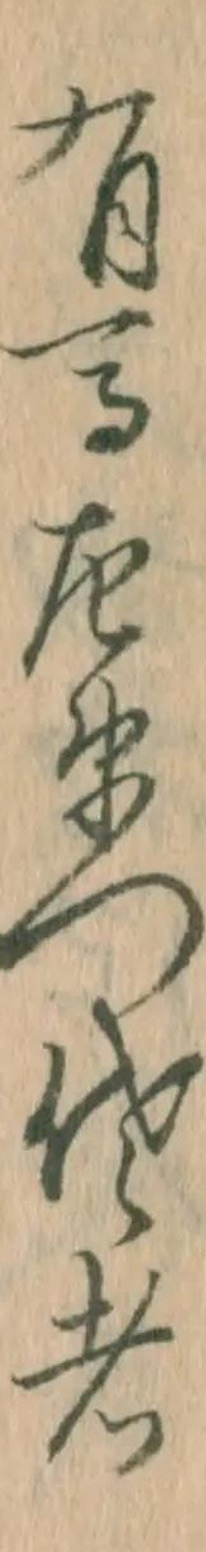有馬左衛門佐者
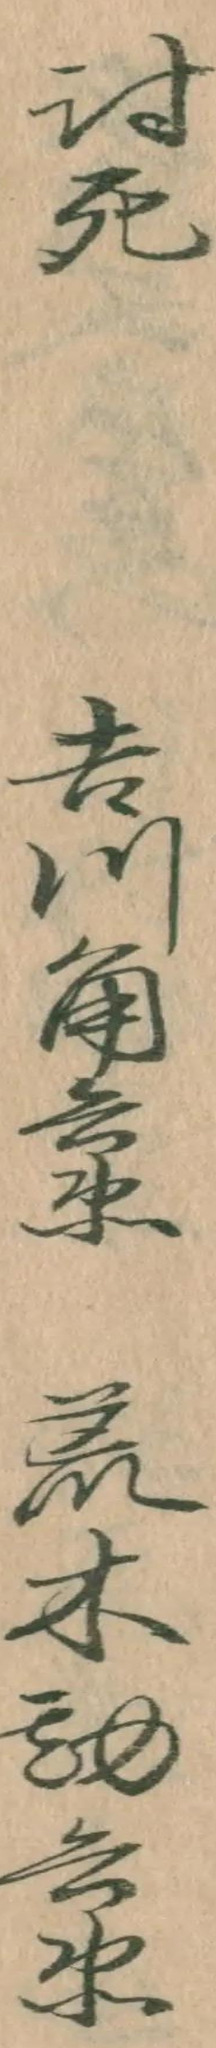討死吉川角兵衛荒木勘兵衛
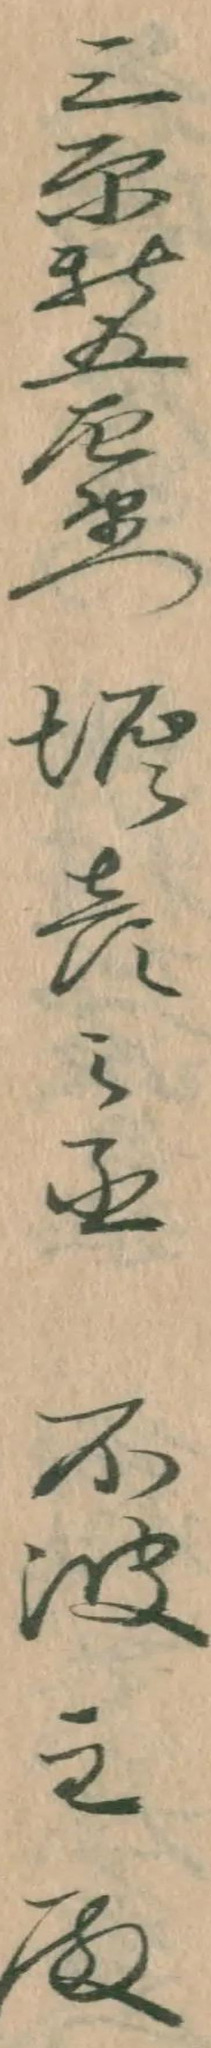三原新五左衛門堀彦之丞不波主殿
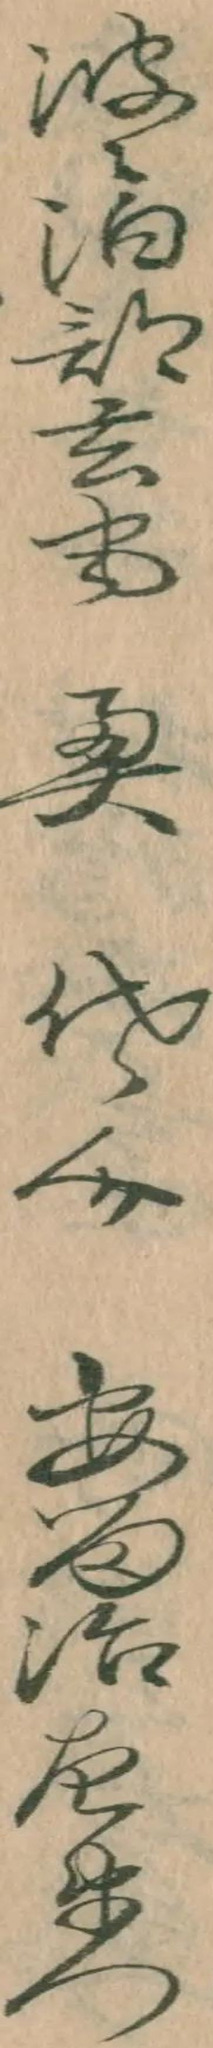波々泊部玄宅奥彦之丞安留治左衛門
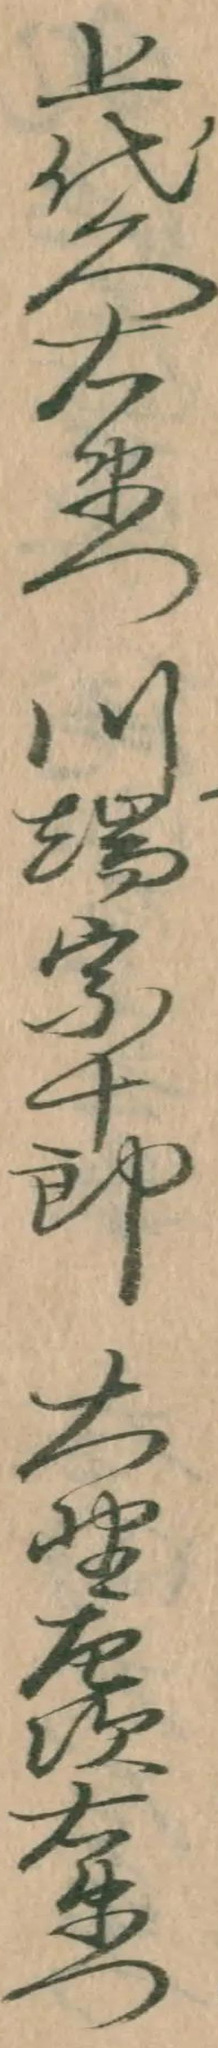上代久右衛門川端宗十郎大野左次右衛門
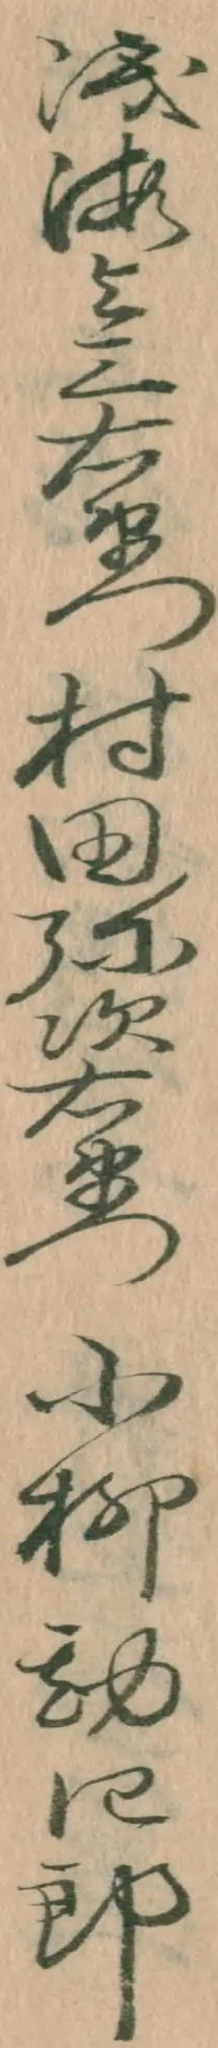浅海与三右衛門村田弥次右衛門小柳勘四郎
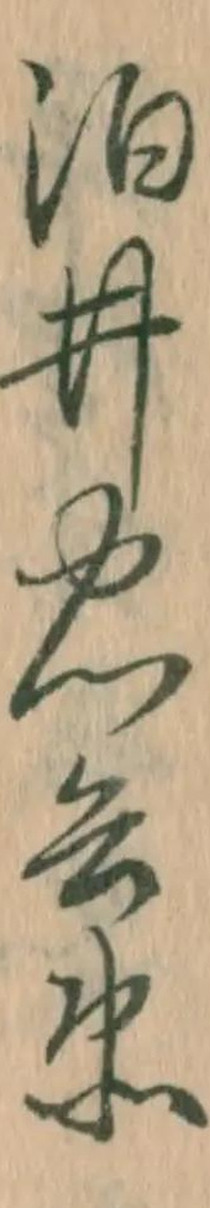泊井忠兵衛
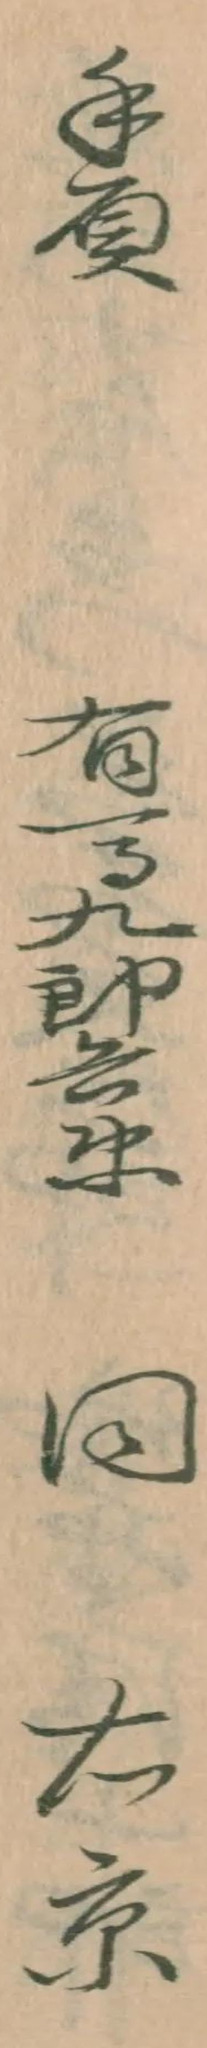手負有馬九郎兵衛同右京
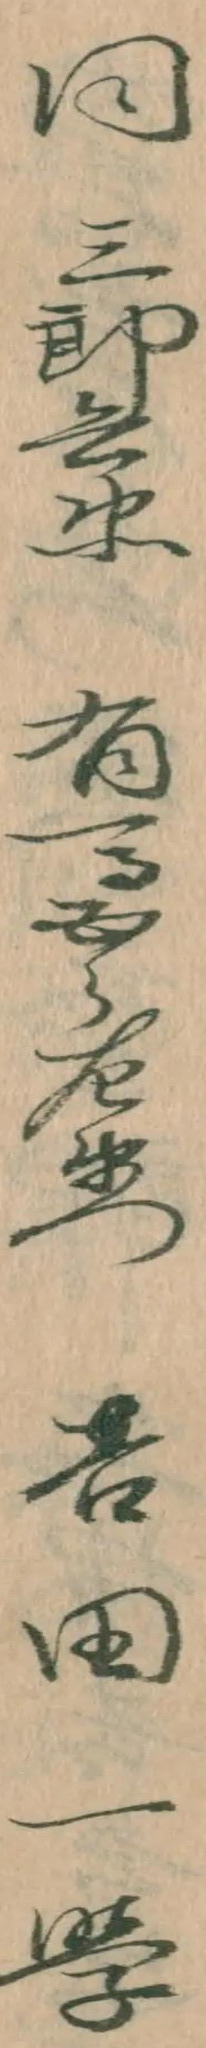同三郎兵衛有馬五郎左衛門吉田一学
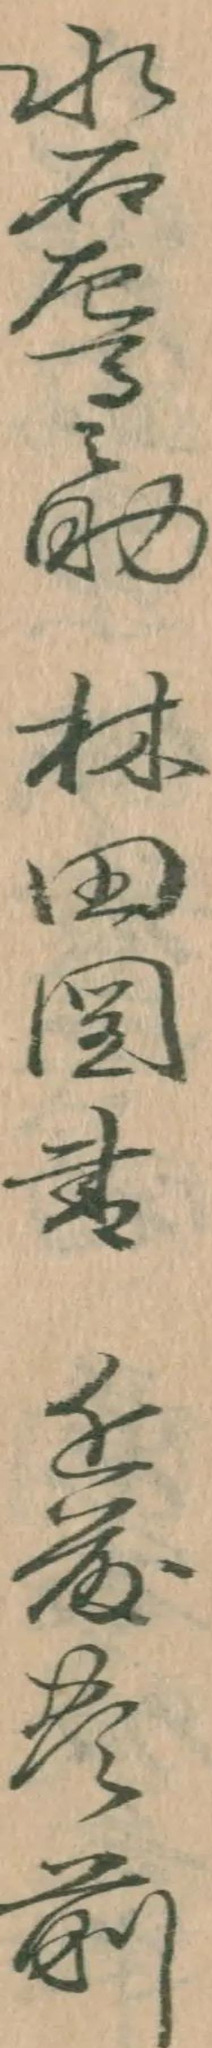水石左馬之助林田図書近藤豊前
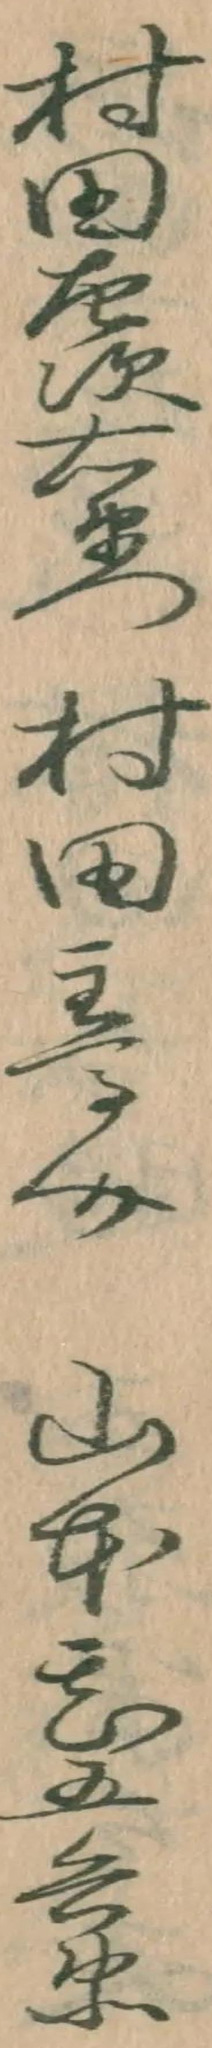村田左次右衛門村田主馬介山本甚五兵衛
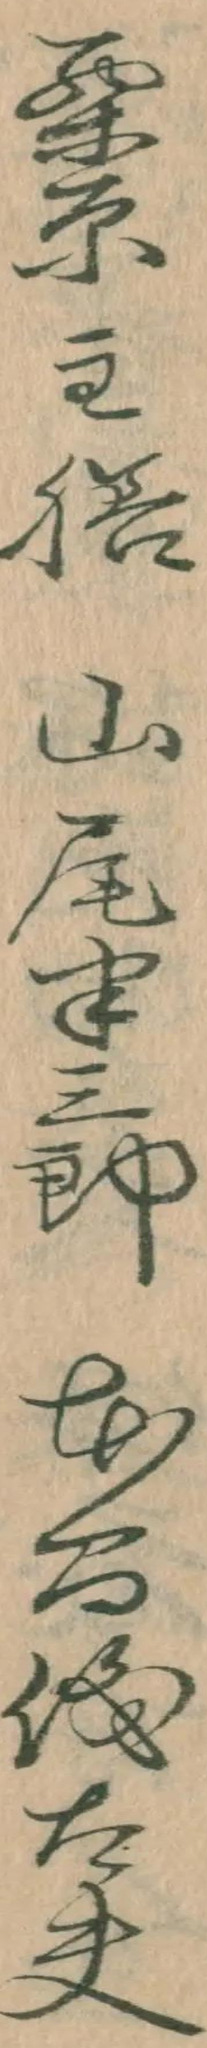栗原主膳山尾半三郎本間儀太夫
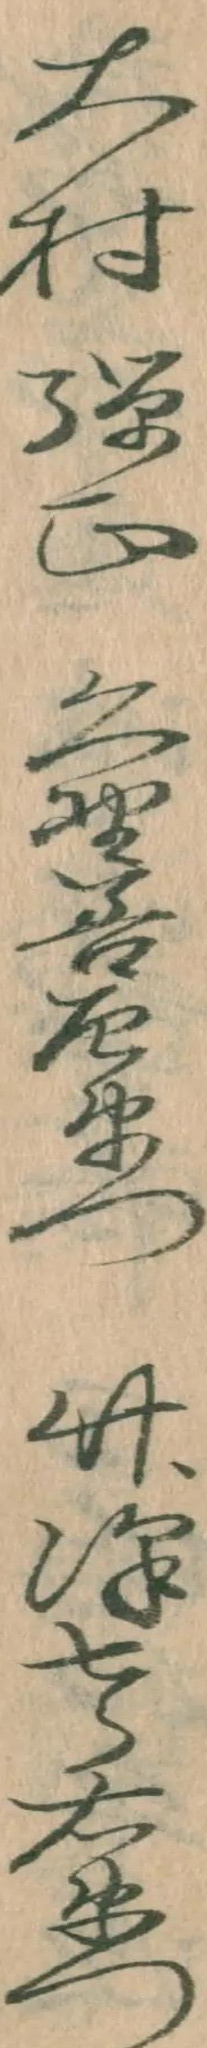大村弾正久野善左衛門竹沢七郎右衛門
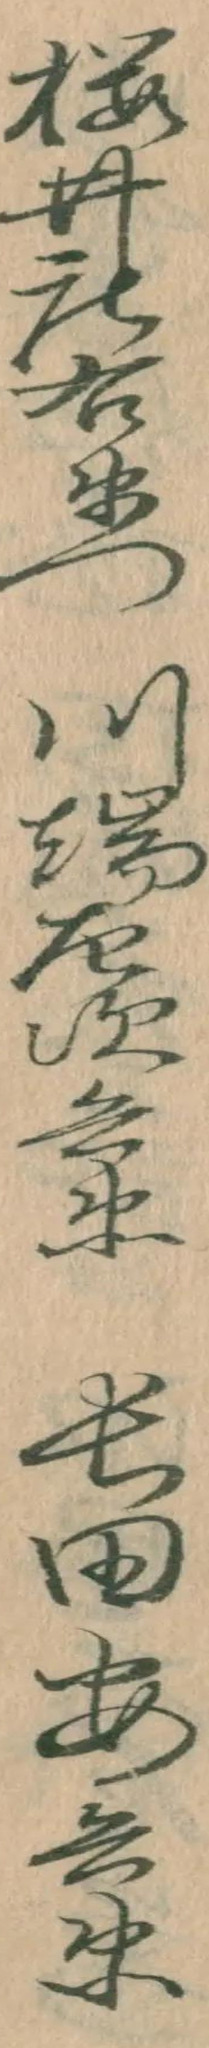桜井庄右衛門川端左次兵衛長田安兵衛
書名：切支丹御退治記 49巻. [9]
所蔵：国立国会図書館 National Diet Library, JAPAN
